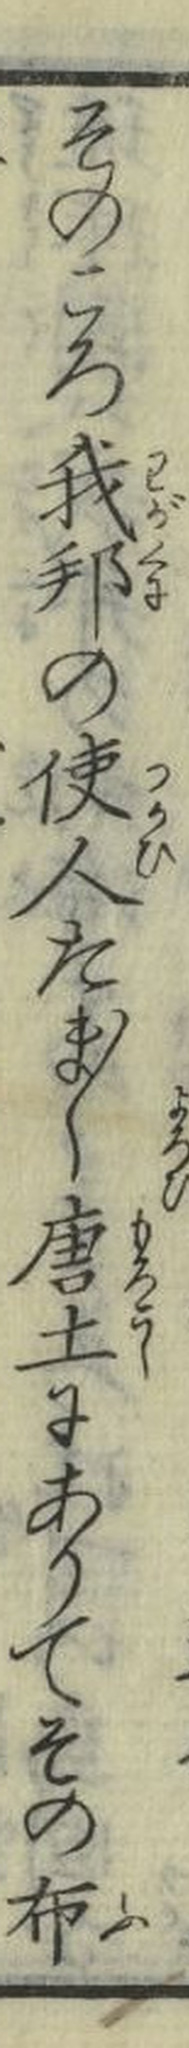そのころ我邦の使人たま〳〵唐土にありてその布
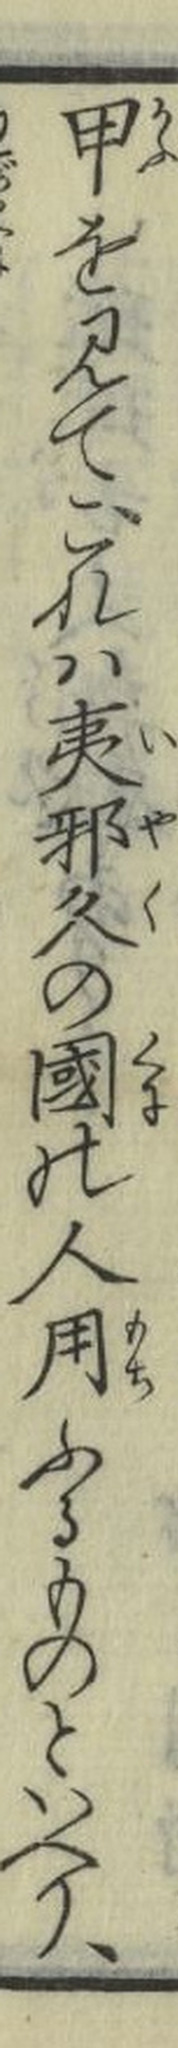甲を見て、これは夷邪久の国の人用ふるものといへり、
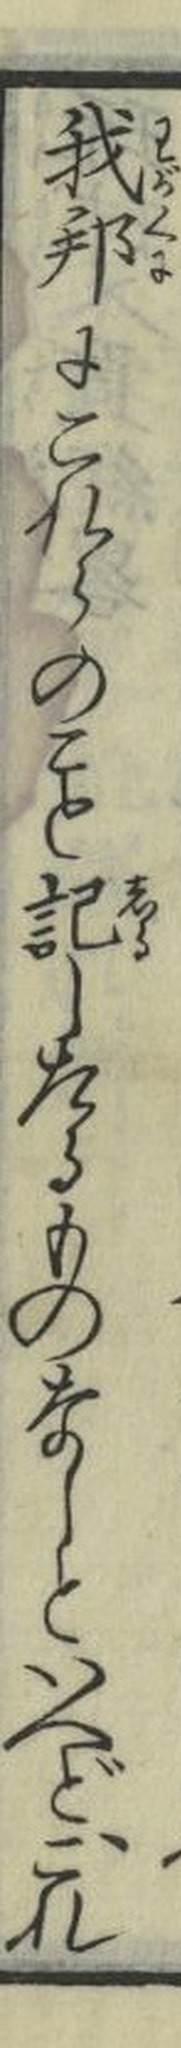我邦にこれらのこと記したるものなしといへど、これ
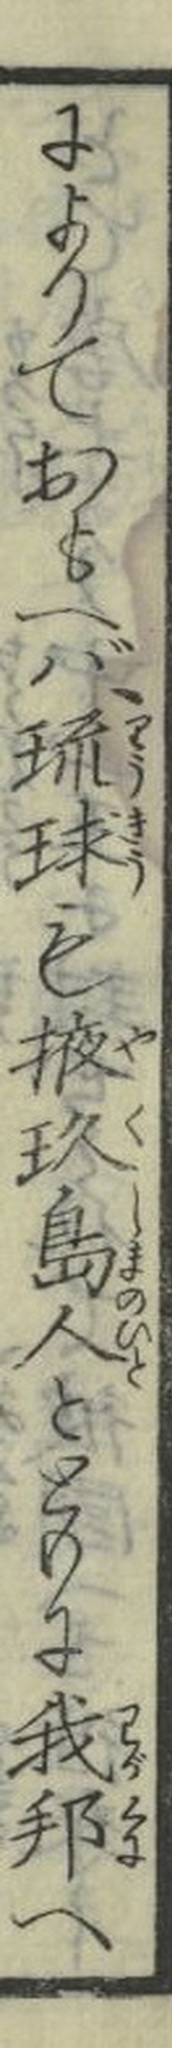によりておもへば、琉球も掖玖島人とともに我邦へ
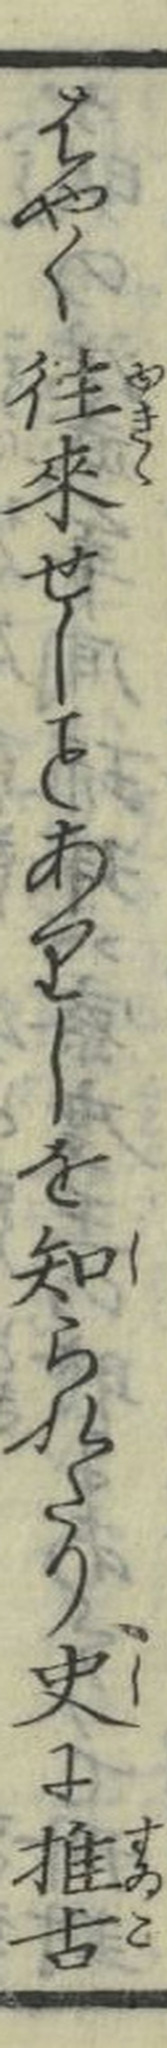はやく往来せしことありしを知られたり、史に推古
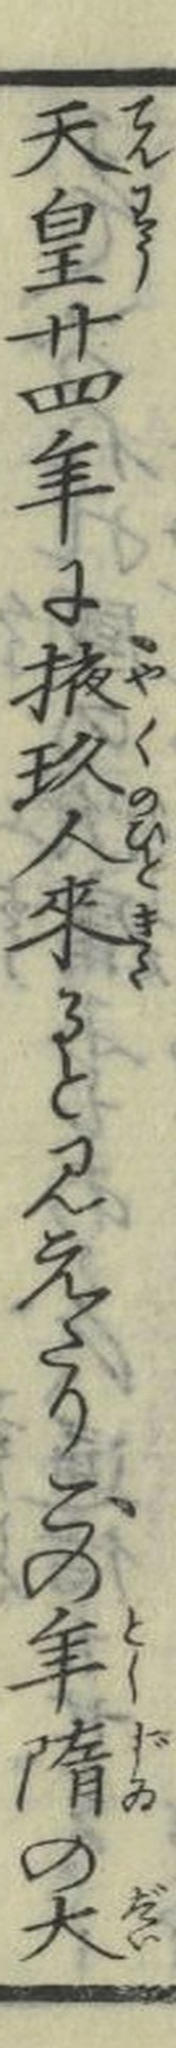天皇廿四年に、掖玖人来ると見えたり、この年隋の大
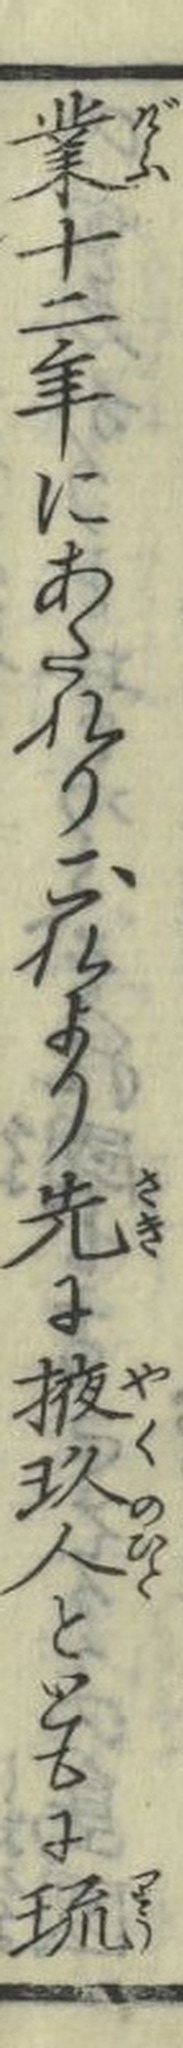業十二年にあたれり、これより先に掖玖人とともに琉
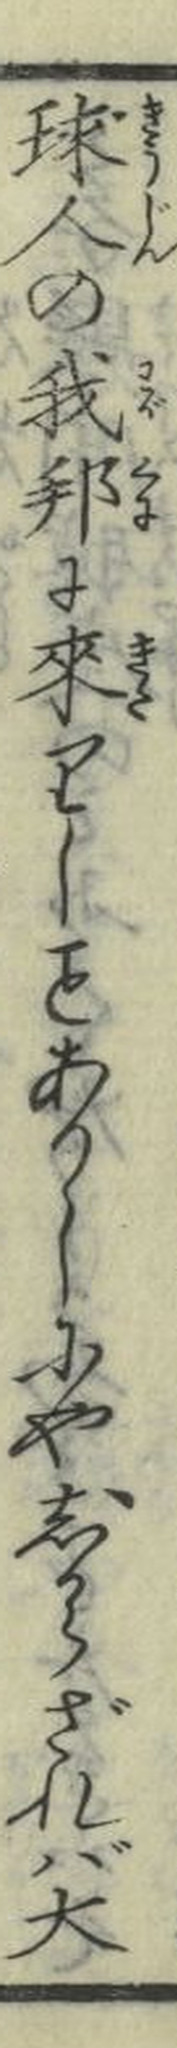球人の我邦に来りしことありしにや、しからざれば大
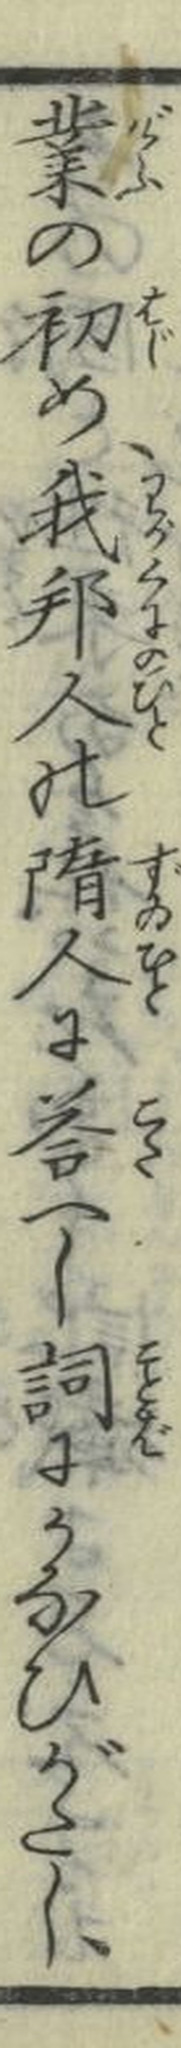業の初め、我邦人の隋人に答へし詞にかなひがたし、
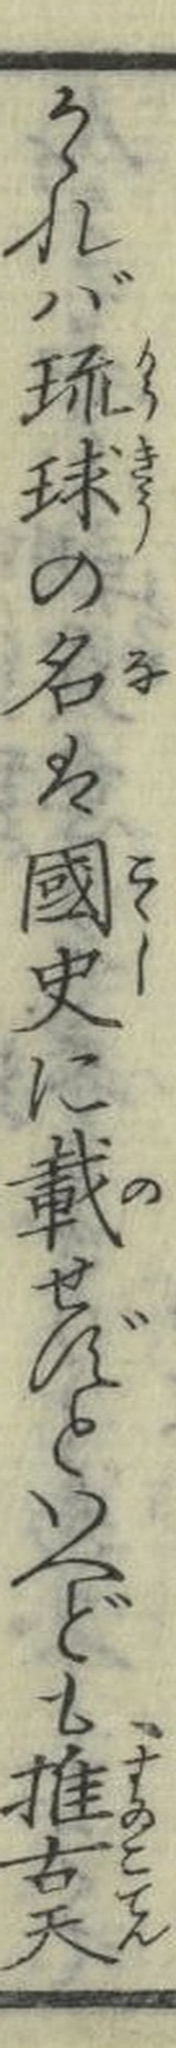かゝれば琉球の名は国史に載せずといへども、推古天
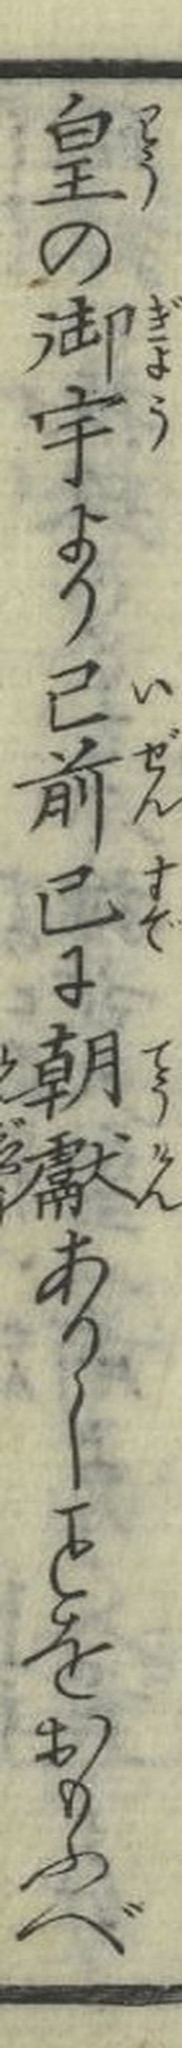皇の御宇より、已前已に朝献ありしことをおもふべ

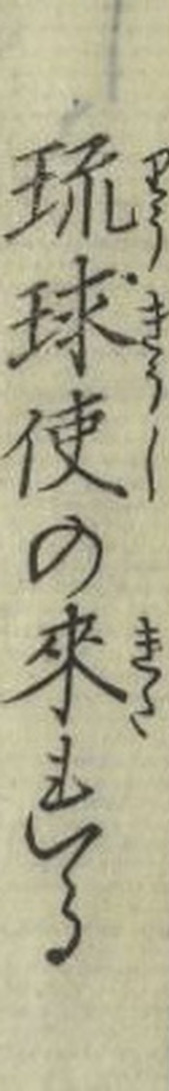琉球使の来れる
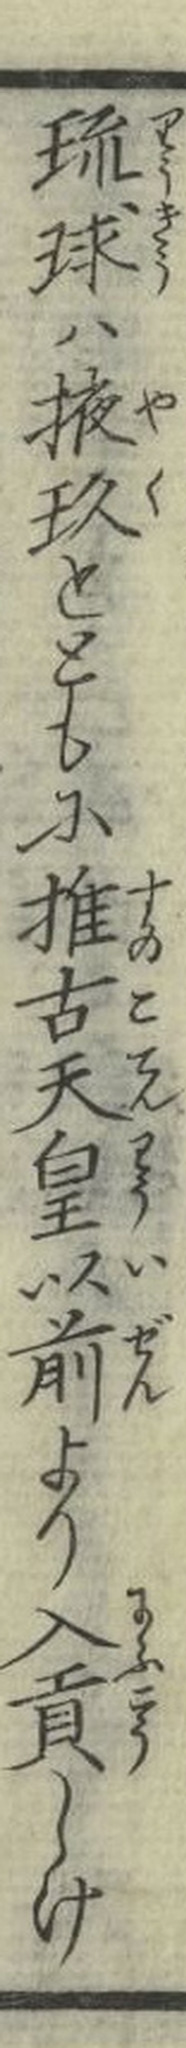琉球は掖玖とともに推古天皇以前より入貢しけ
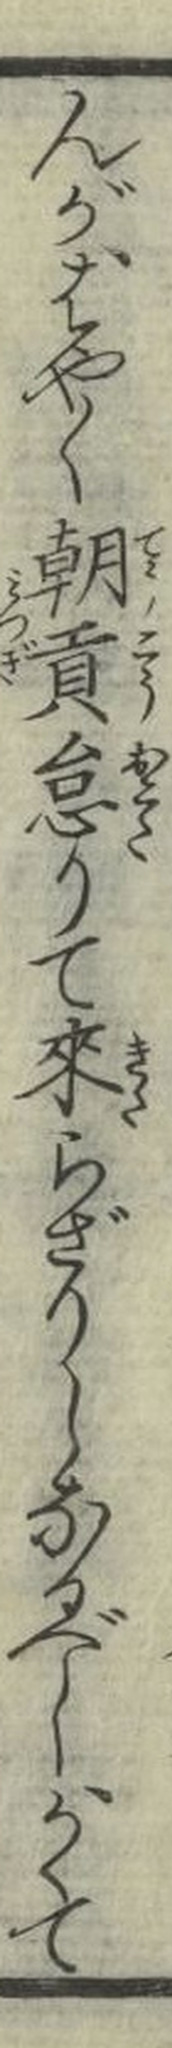んが、はやく朝貢怠りて来らざりしなるべし、かくて
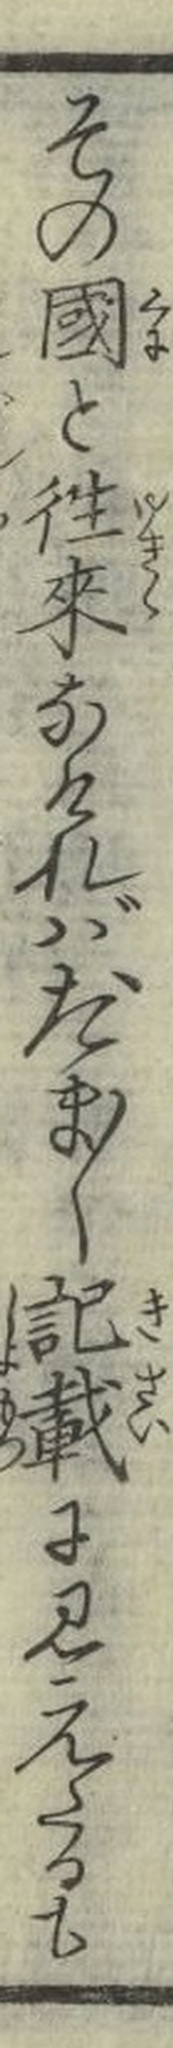その国と往来なければ、たま〳〵記載に見えたるも
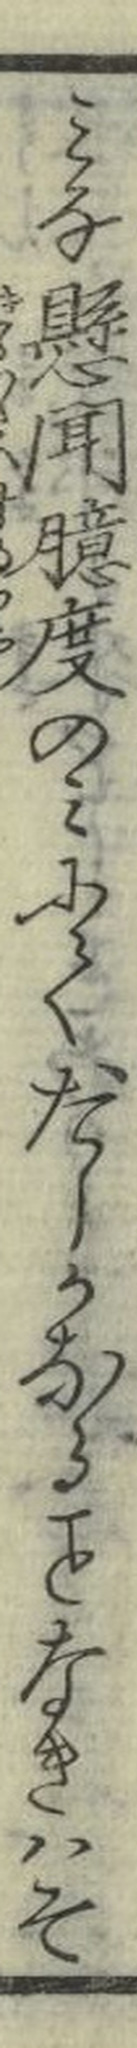みな懸聞臆度のみにて、たしかなることなきはそ
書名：琉球入貢紀畧
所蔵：University of the Ryukyus Library
